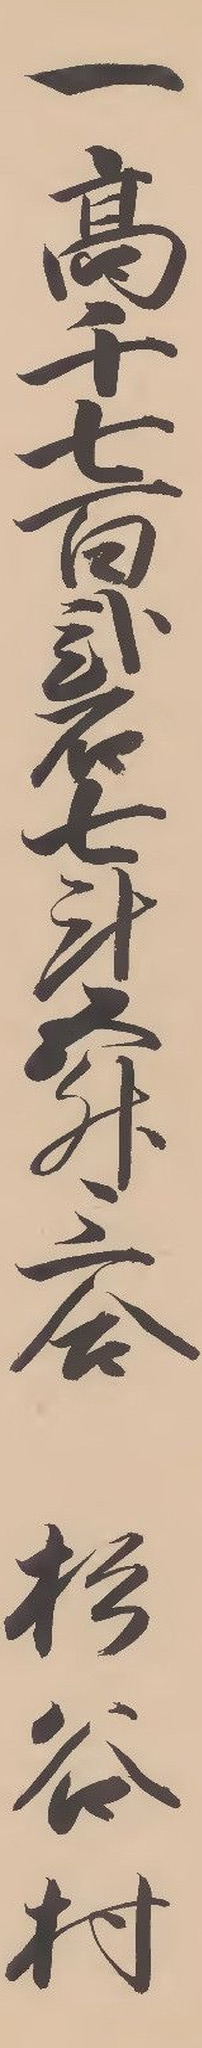一高千七百弐石七斗五升三合杉谷村
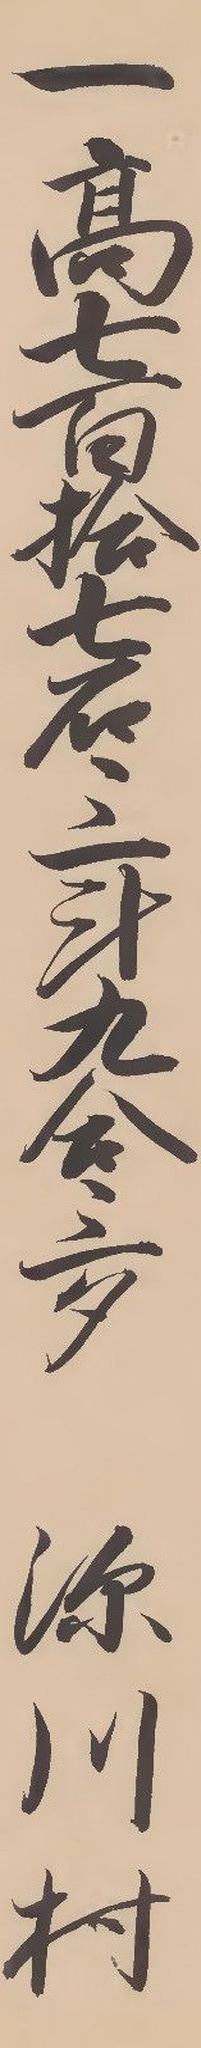一高七百拾七石三斗九合三勺深川村
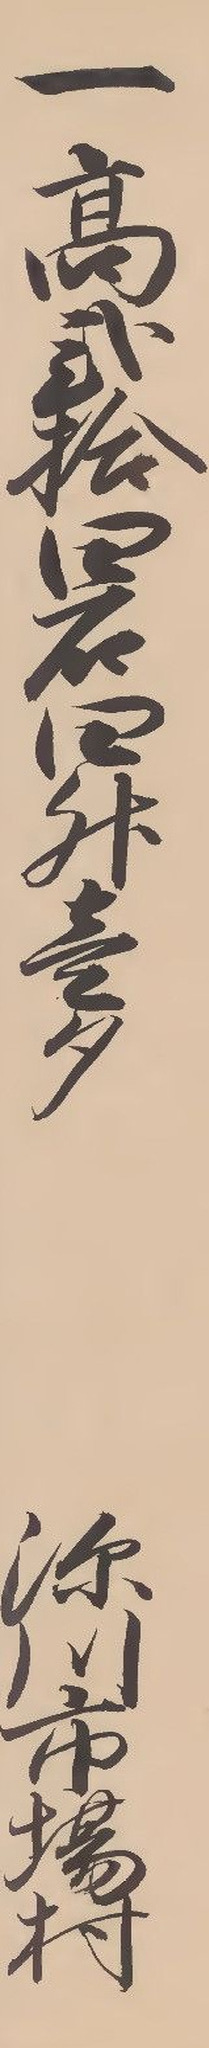一高弐拾四石四升壱勺深川市場村
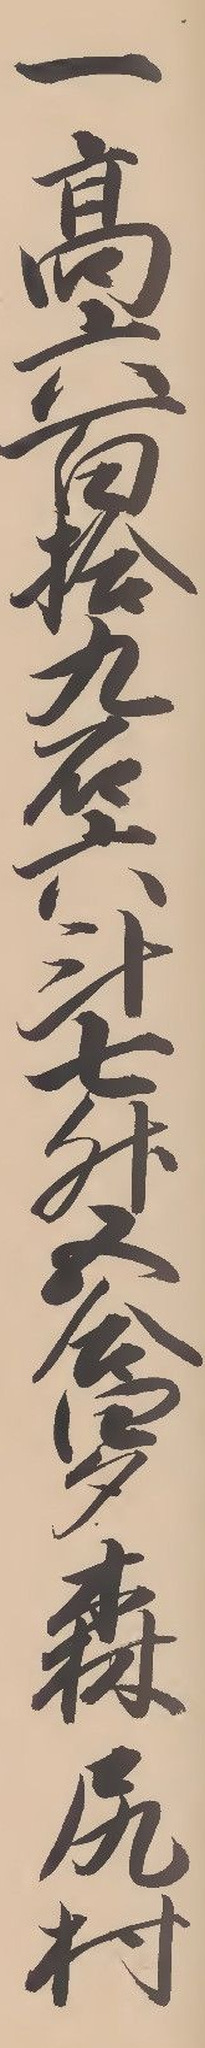一高六百拾九石六斗七升五合四勺森尻村
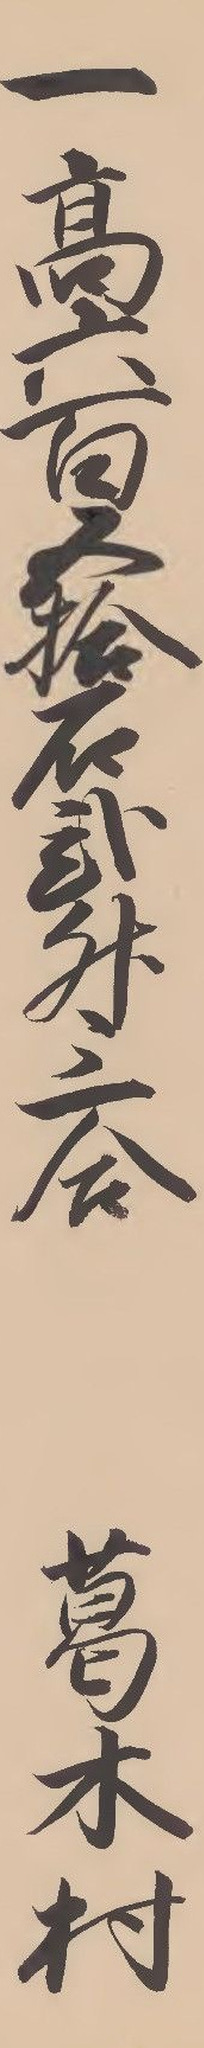一高六百五拾石弐升三合葛木村
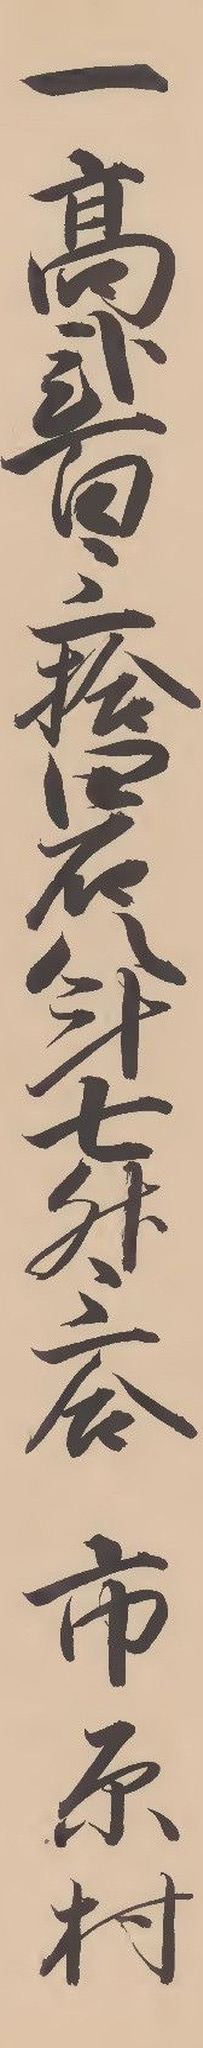一高弐百三拾四石八斗七升三合市原村
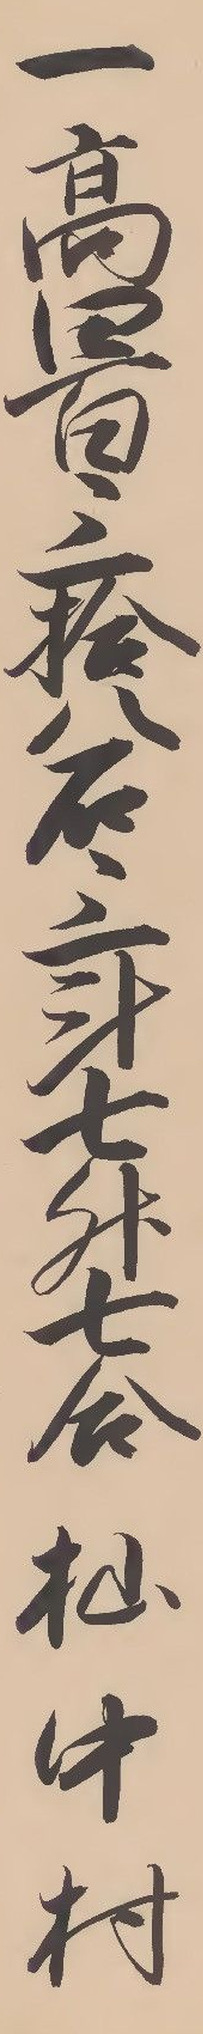一高四百三拾八石三斗七升七合杣中村

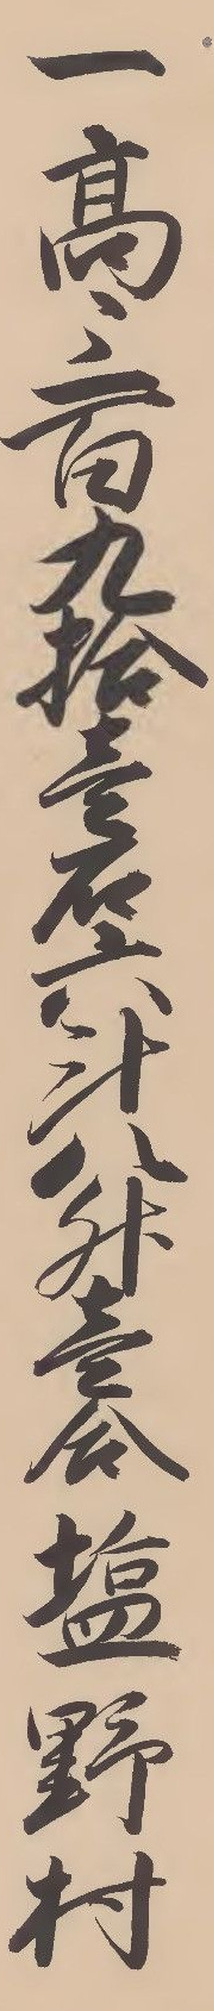一高三百九拾壱石六斗八升壱合塩野村
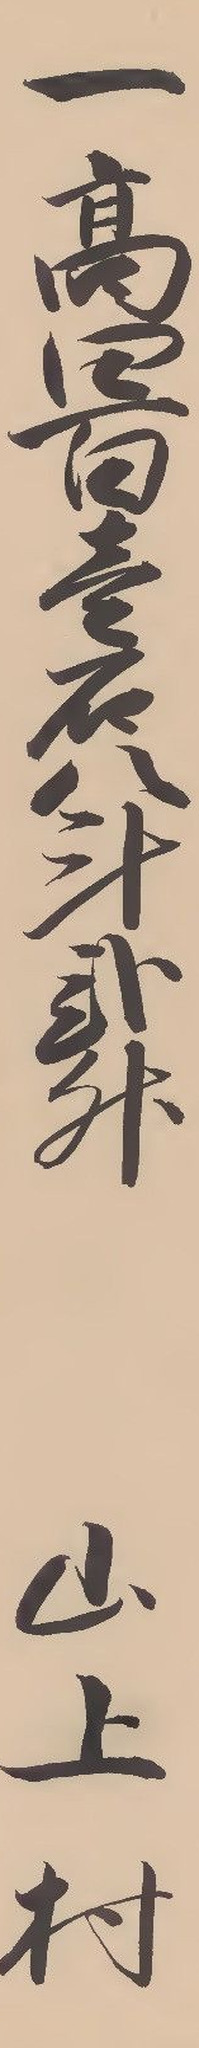一高四百壱石八斗弐升山上村
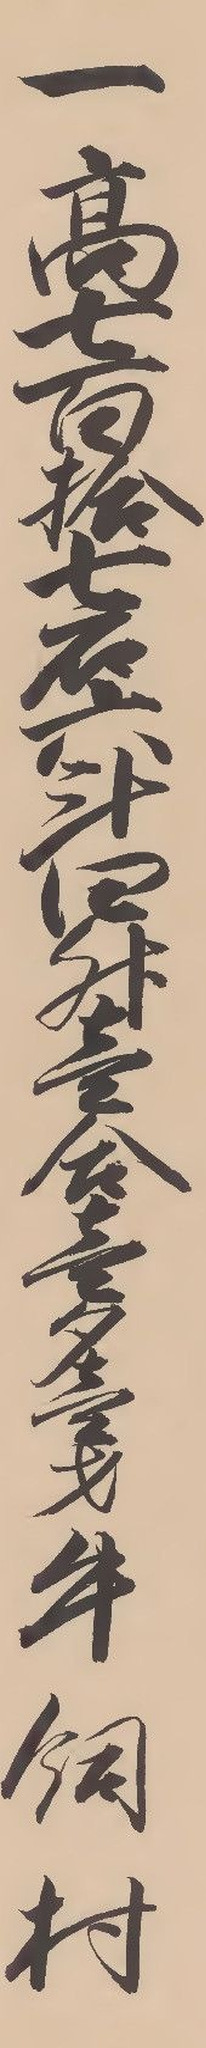一高七百拾七石六斗四升壱合壱勺壱才牛飼村
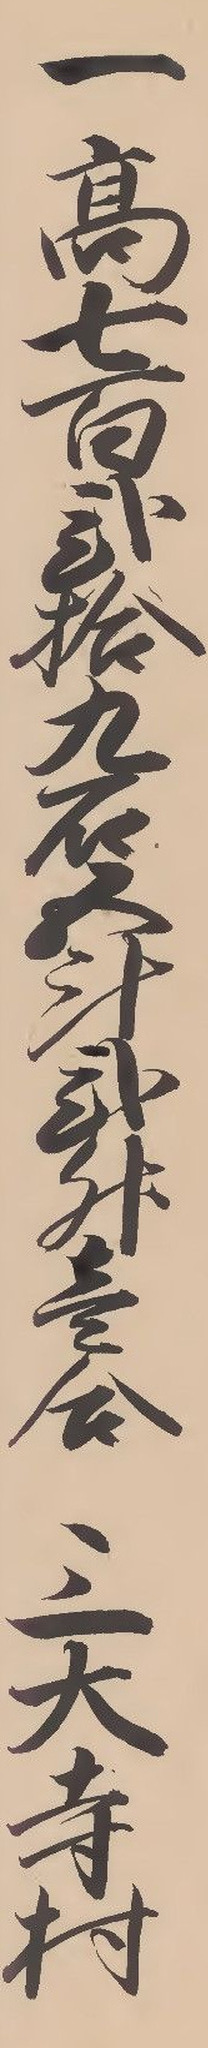一高七百弐拾九石五斗弐升壱合三大寺村
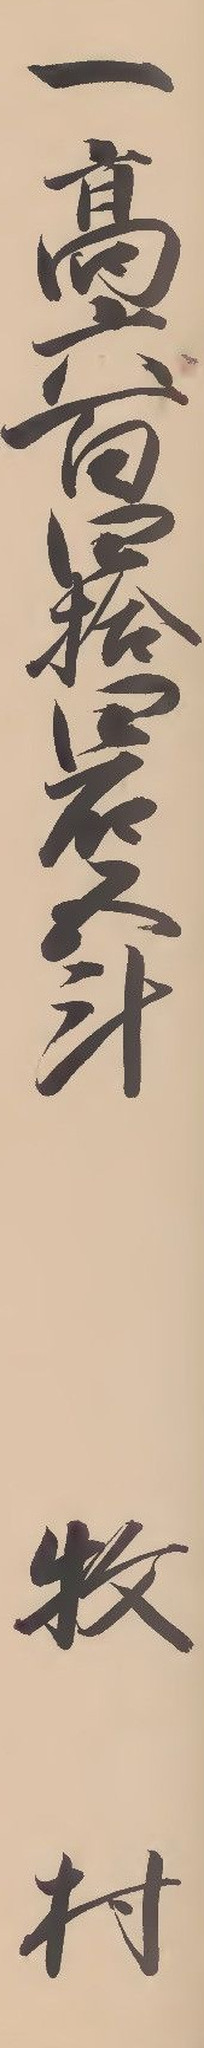一高六百四拾四石五斗牧村
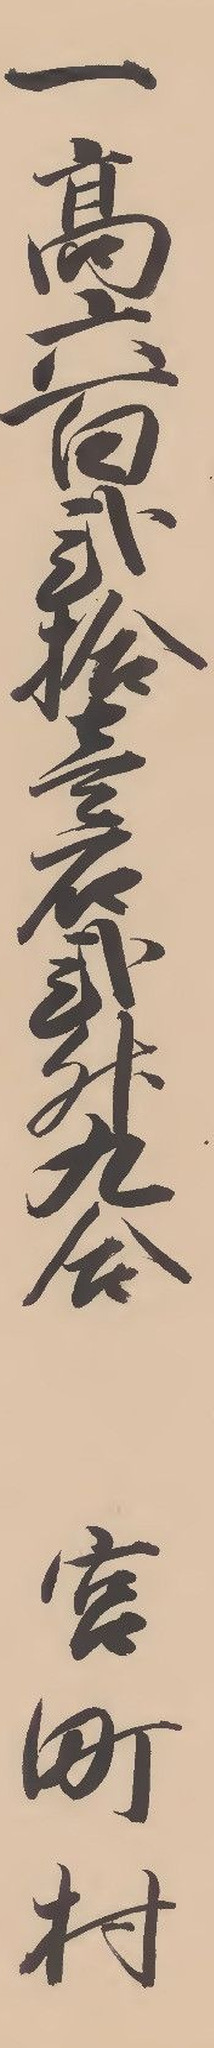一高六百弐拾壱石弐升九合宮町村
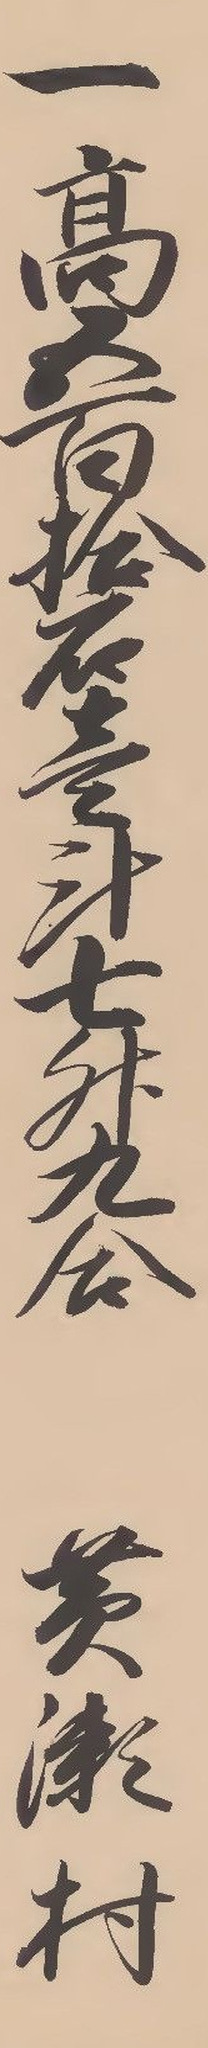一高五百拾石壱斗七升九合黄瀬村
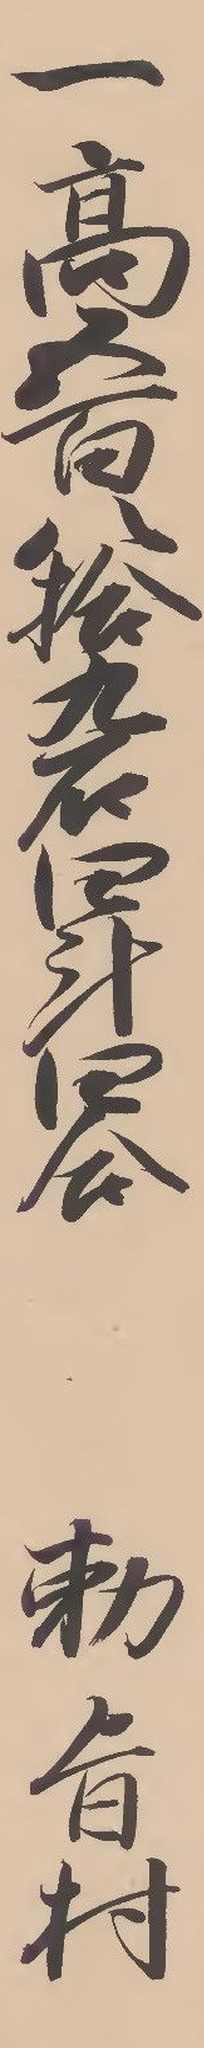一高五百八拾九石四斗四合勅旨村

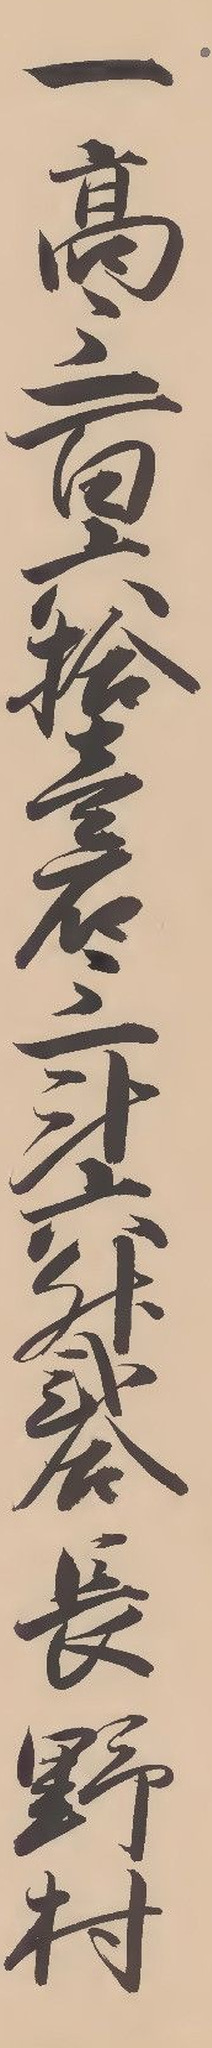一高三百六拾壱石三斗六升弐合長野村
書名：近江国郷帳
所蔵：国立公文書館 National Archives of Japan
